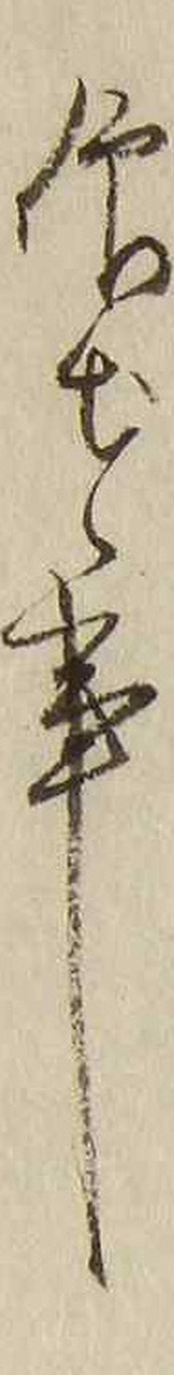仰出候事

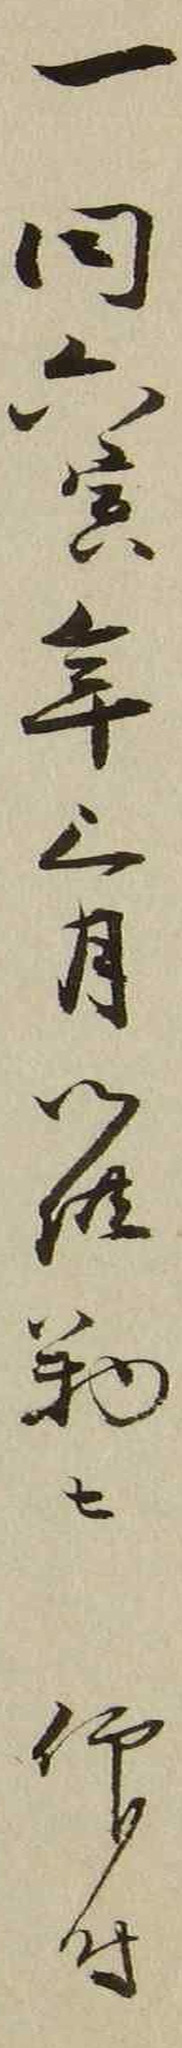一同六寅年三月御供勤被仰付
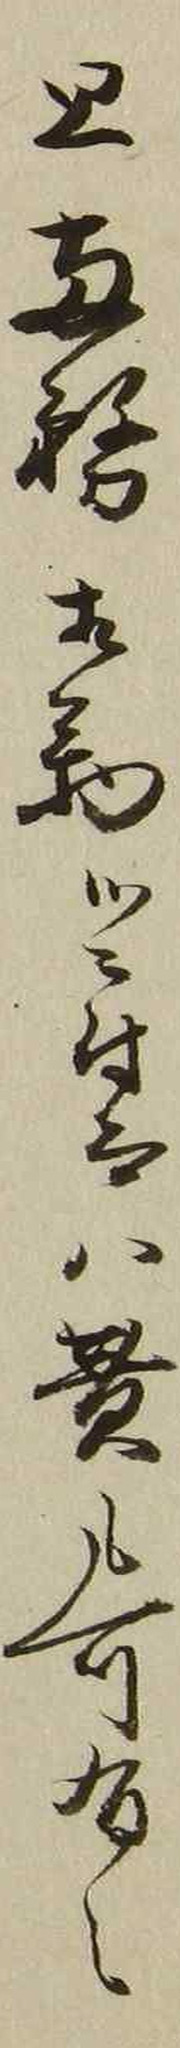且両務相勤候に付而は費も可有之
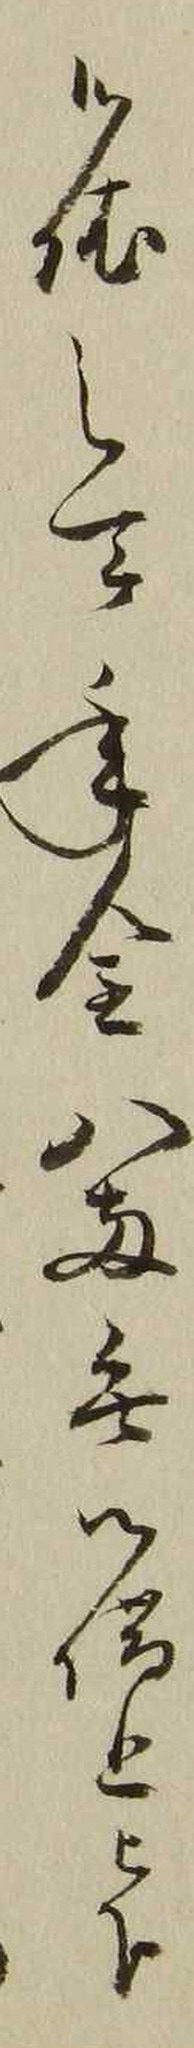候依之一け年金八両無御借上被下
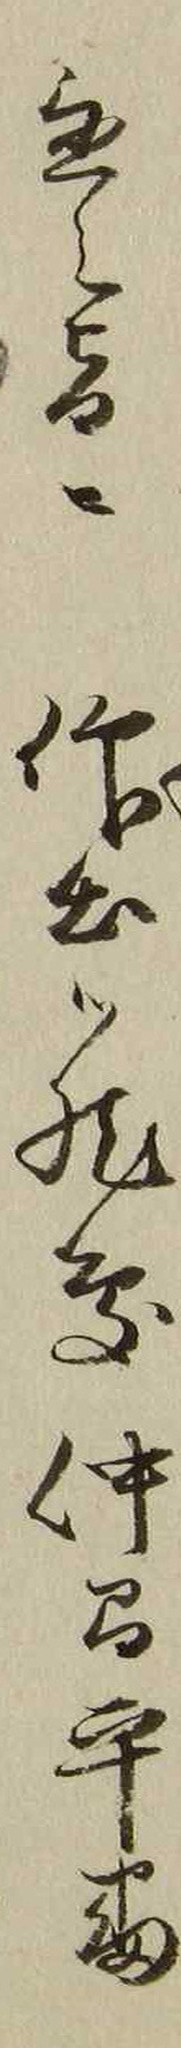置候旨被仰出候然処仲間平番
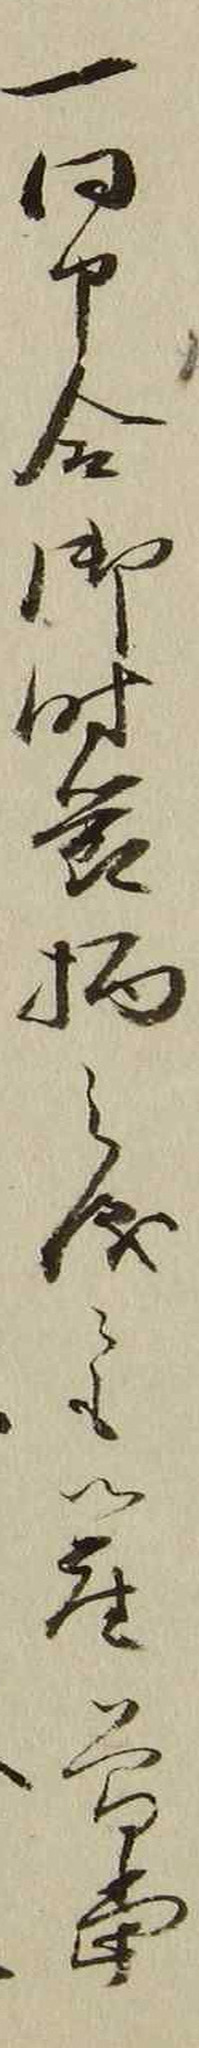一同申合御時節柄之儀にも御座候間当
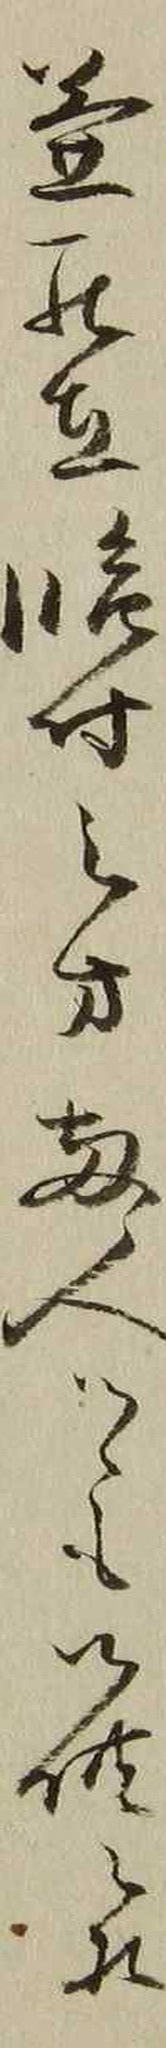兼罷在臨時之方両人つゝも御供に罷
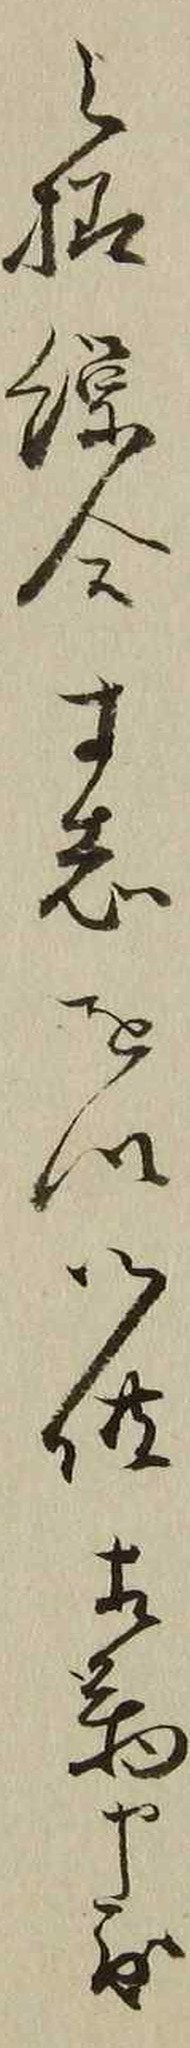之様繰合寸志を以御供相勤申度
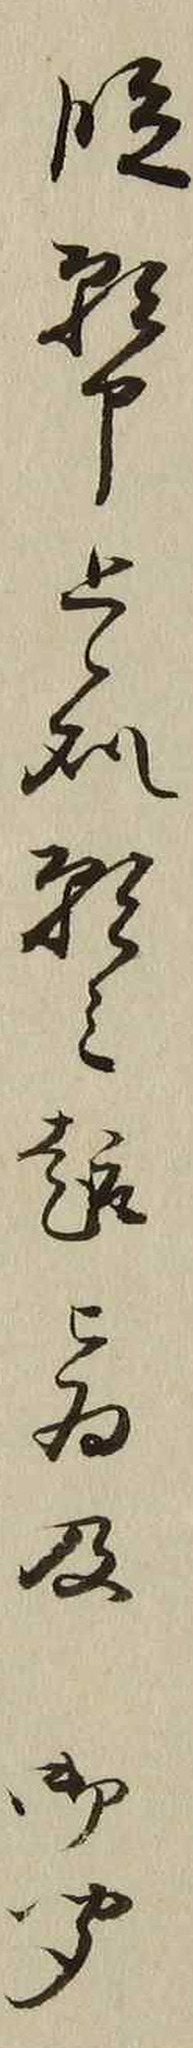段願申上候処願之趣被為及御聞
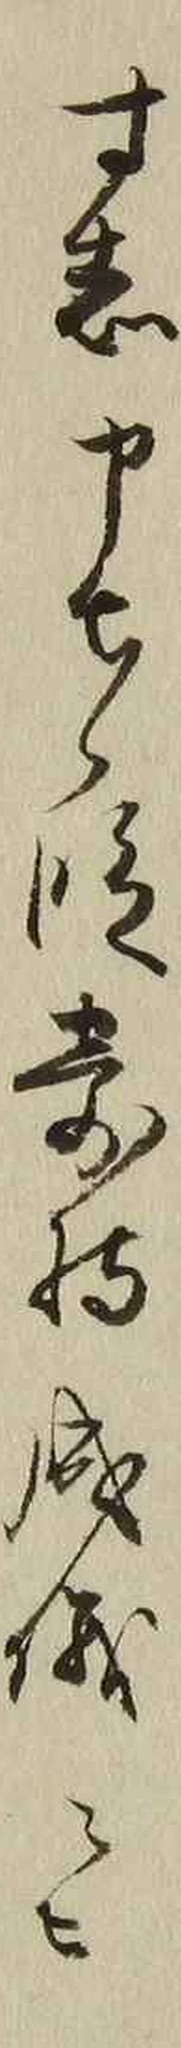寸志申上候段奇特成儀に被
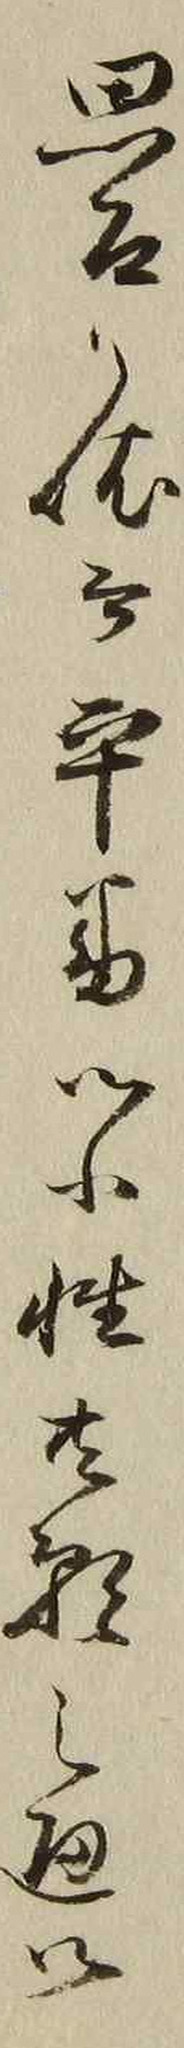思召候依而平番御小姓共願之通御
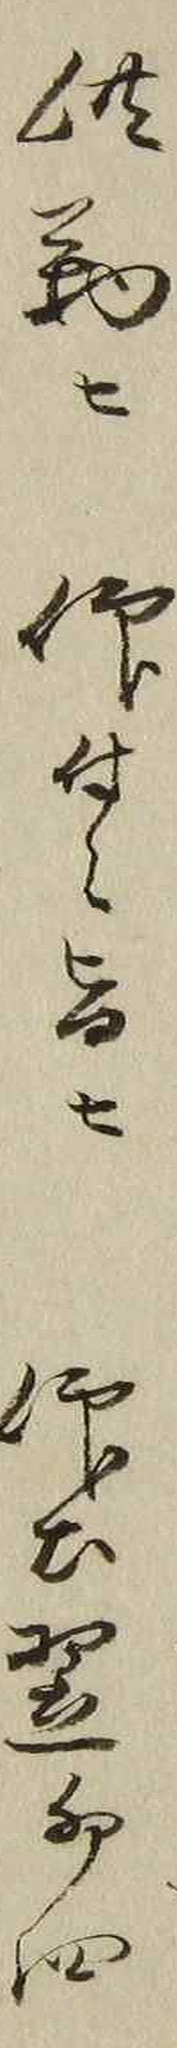供勤被仰付候旨被仰出翌卯四
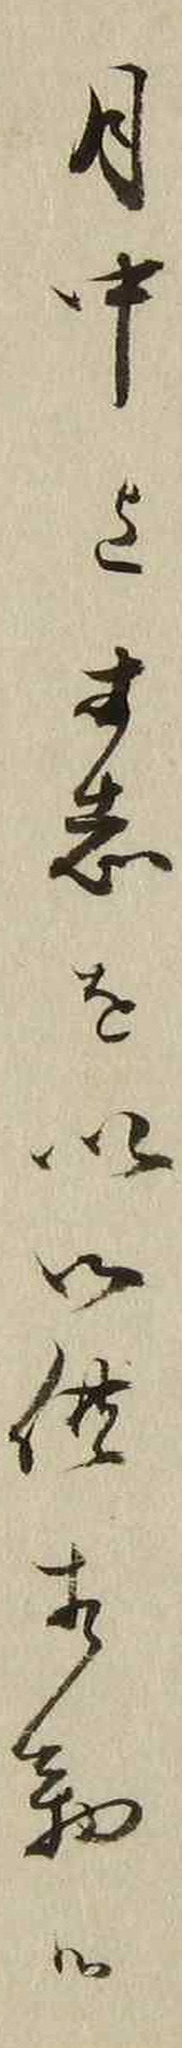月中迄寸志を以御供相勤候
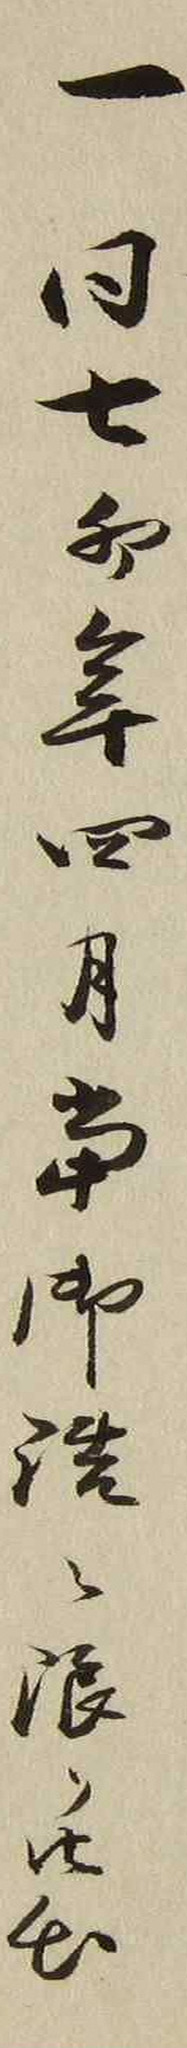一同七卯年四月当御詰に限り御出
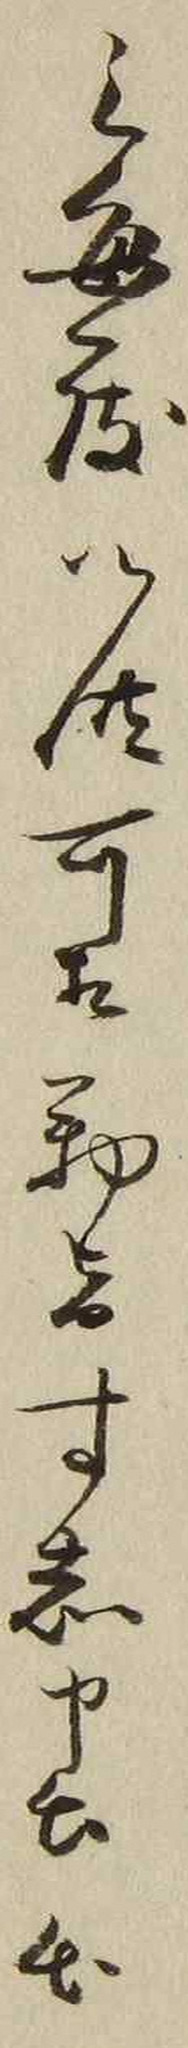之毎度御供可相勤旨寸志申出出
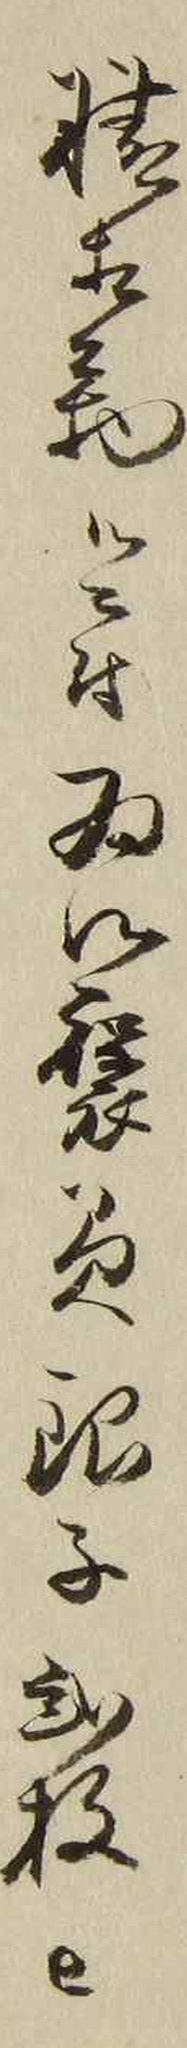精相勤候に付為御褒美銀子弐枚被
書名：諸士系譜　巻之292　き之部1
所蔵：会津若松市立会津図書館
